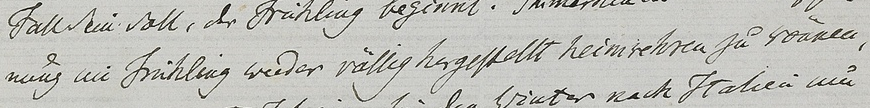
nung im Frühling wieder völlig hergestellt heimkehren zu können,
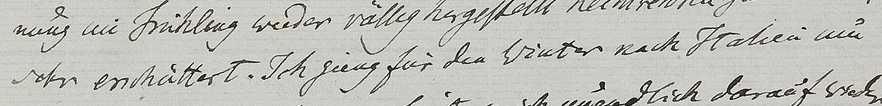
sehr erschüttert. Ich gieng für den Winter nach Italien um
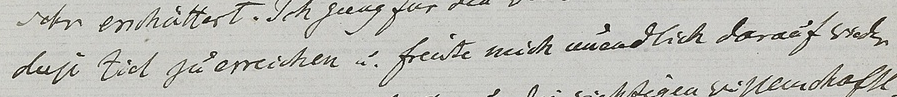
diess Ziel zu erreichen u. freute mich unendlich darauf wieder
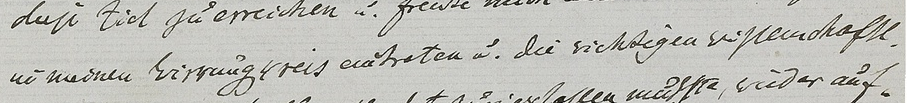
in meinen Wirkungskreis eintreten u. die wichtigen wissenschaftl.
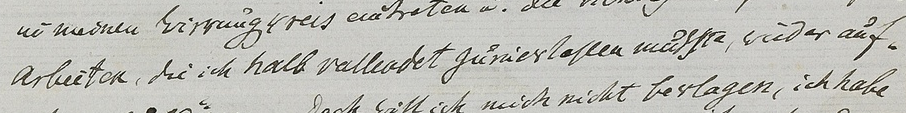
Arbeiten, die ich halb vollendet zurücklassen musste, wieder auf-
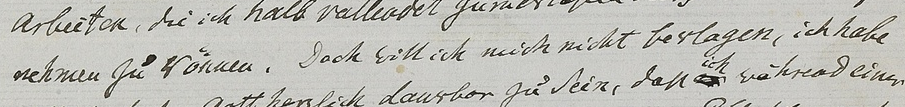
nehmen zu können. Doch will ich mich nicht beklagen, ich habe
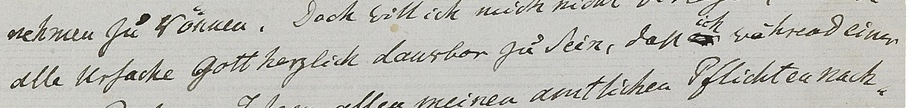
alle Ursache Gott herzlich dankbar zu sein, dass erich während einer
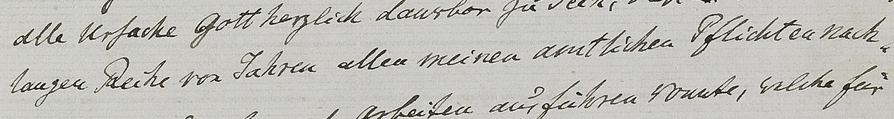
langen Reihe von Jahren allen meinen amtlichen Pflichten nach-
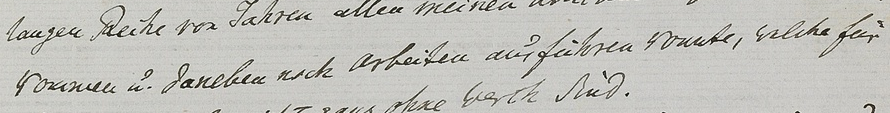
kommen u. daneben noch Arbeiten ausführen konnte, welche für
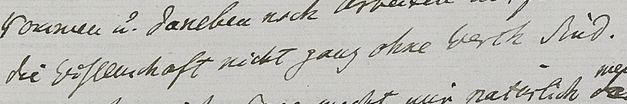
die Wissenschaft nicht ganz ohne Werth sind.
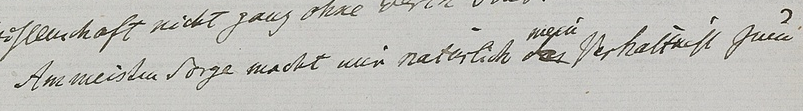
Am meisten Sorge macht mir natürlich dasmein Verhältniss zum
